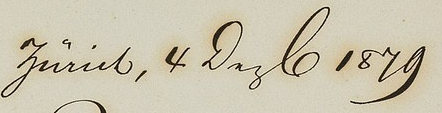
Zürich, 4 Dezb 1879
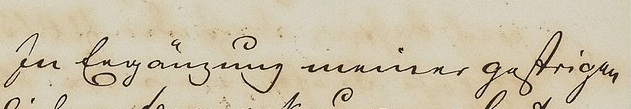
In Ergänzung meiner gestrigen
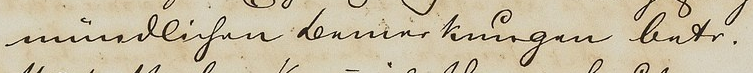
mündlichen Bemerkungen betr.
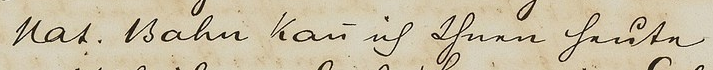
Nat.Bahn kann ich Ihnen heute
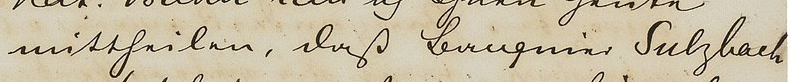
mittheilen, daß Banquier Sulzbach
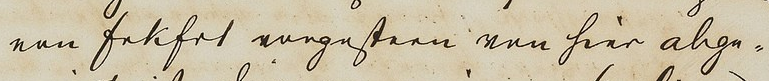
von Frkfrtvorgestern von hier abge-
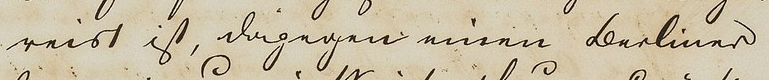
reist ist, dagegen einen Berliner
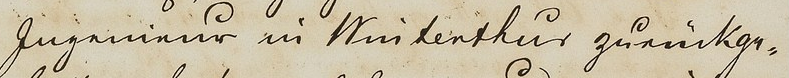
Ingenieur in Winterthur zurückge-
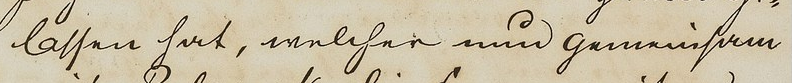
lassen hat, welcher nun gemeinsam
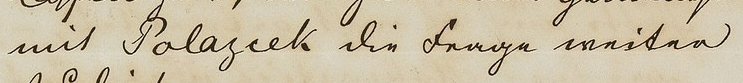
mit Polazcek die Frage weiter
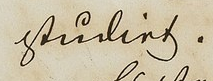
studirt.
